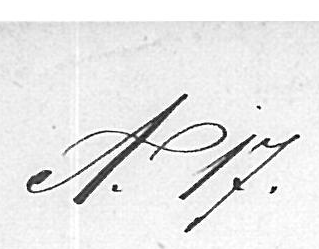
A. 17.
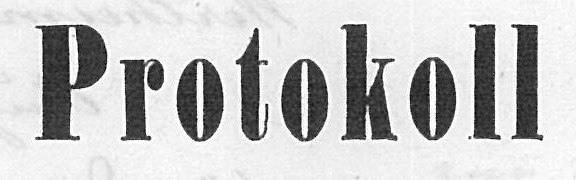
Protokoll
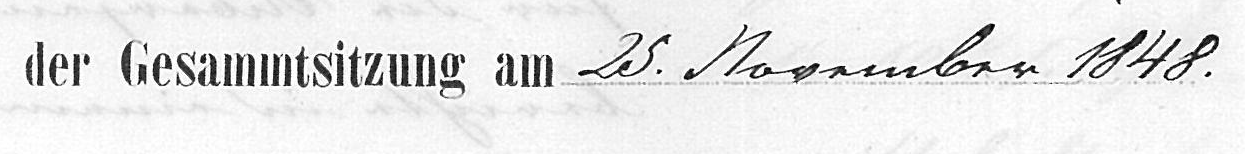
der Gesammtsitzung am 25. November 1848
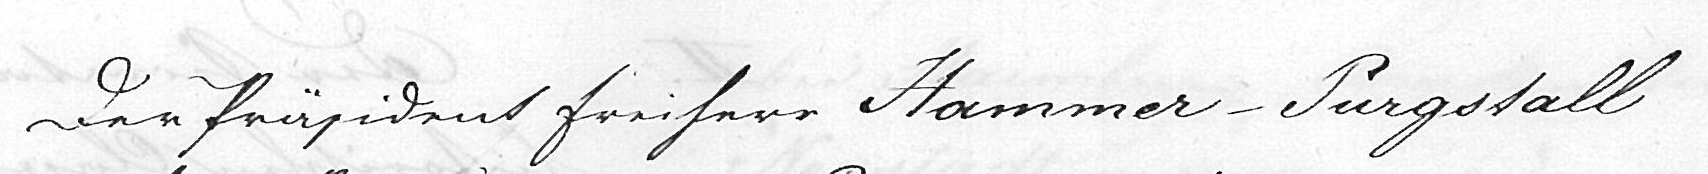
Der Präsident Freiherr Hammer-Purgstall
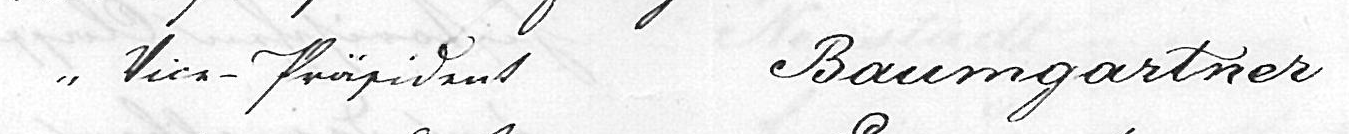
" Vice-Präsident Baumgartner
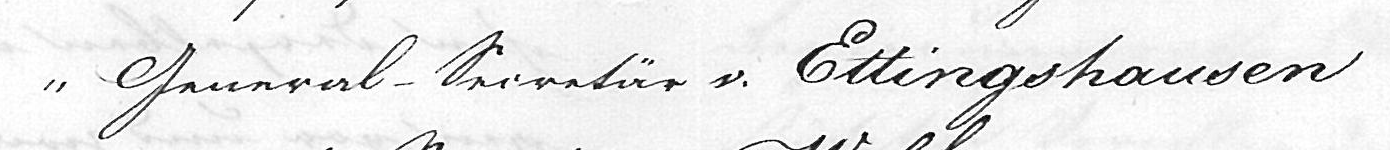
" General-Secretär v. Ettingshausen
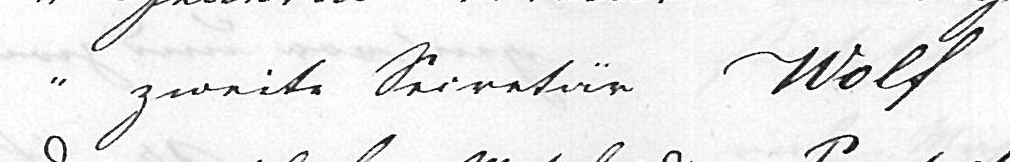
" zweite Secretär Wolf
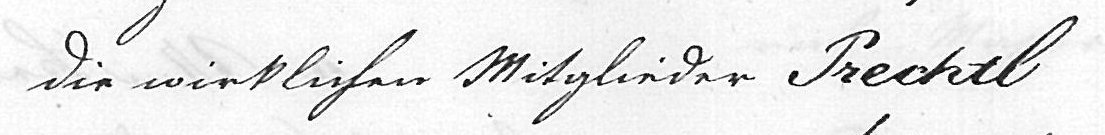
die wirklichen Mitglieder Prechtl
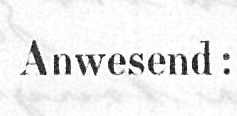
Anwesend:
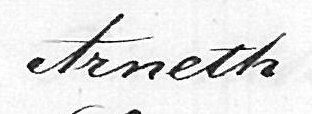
Arneth
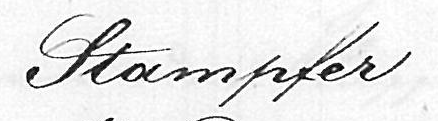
Stampfer
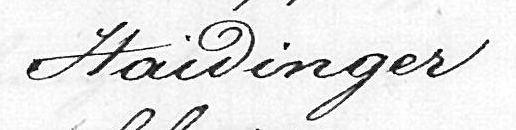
Haidinger
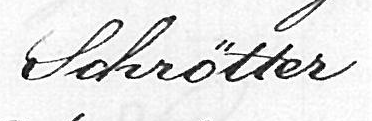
Schrötter
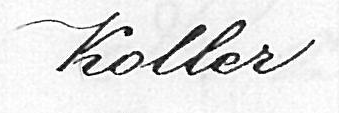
Koller
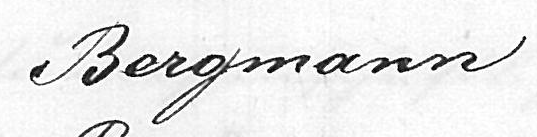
Bergmann
